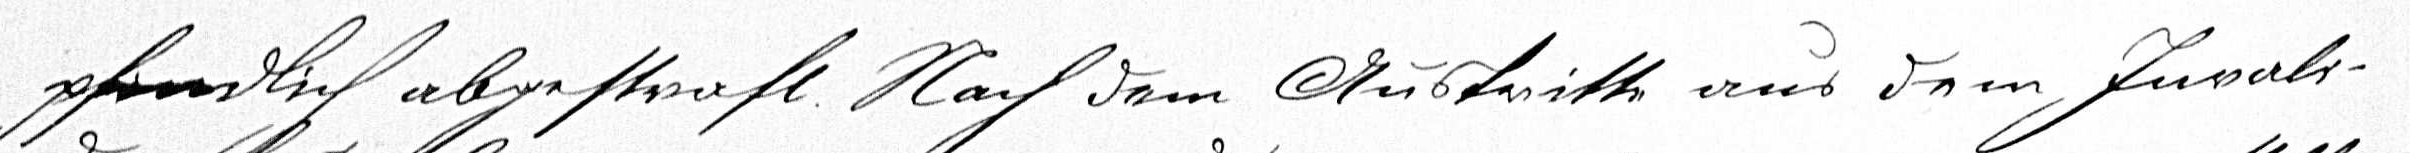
pfindlich abgestraft. Nach dem Austritte aus dem Invali¬
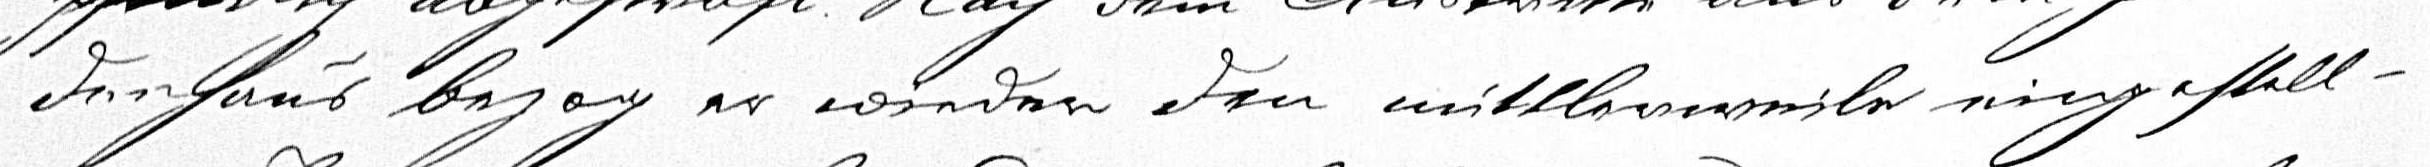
denhaus bezog er wieder den mittlerweile eingestell¬
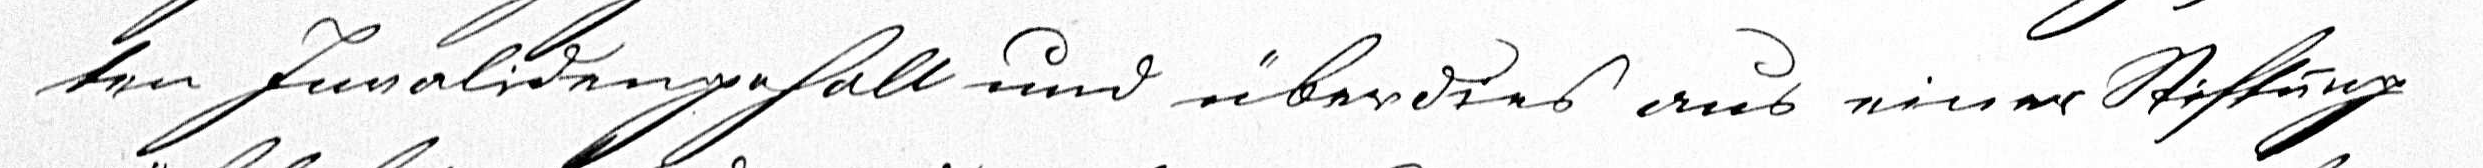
ten Invalidengehalt und überdies aus einer Stiftung
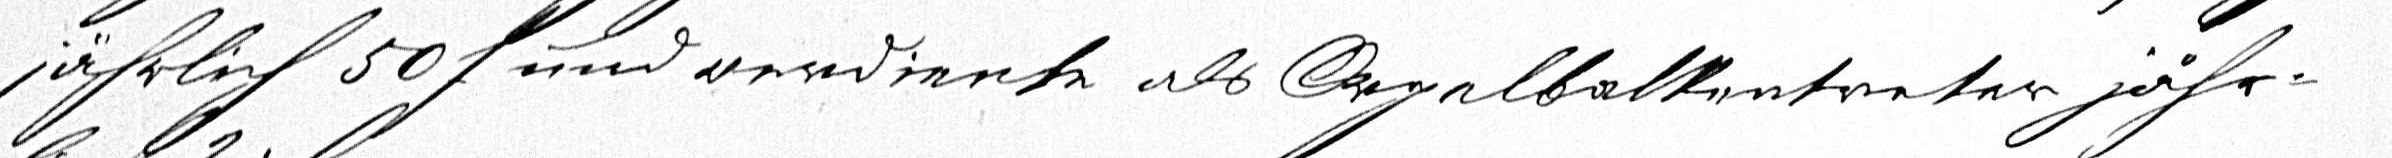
jährlich 50f und verdiente als Orgelbalkentreter jähr¬
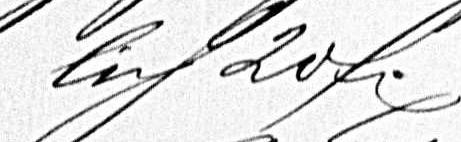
lich 20f.
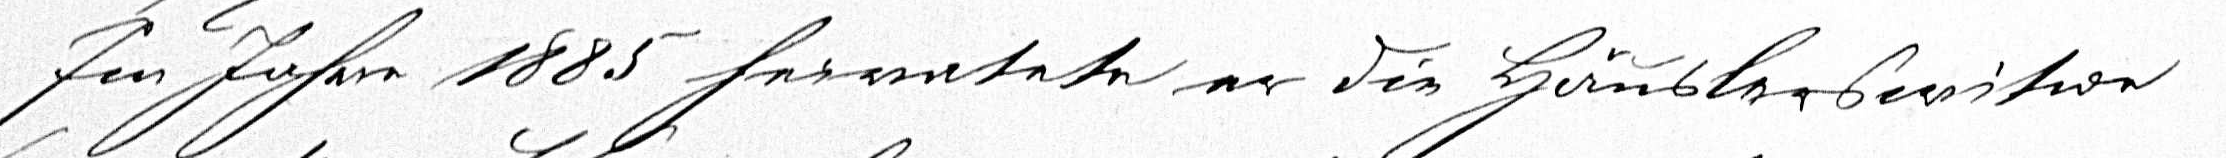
Im Jahre 1885 heiratete er die Häuslerswitwe
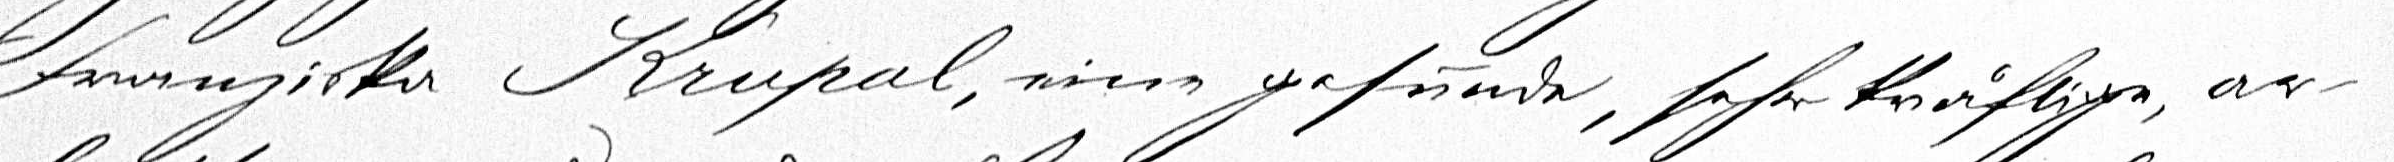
Franziska Krupal, eine gesunde, sehr kräftige, ar¬
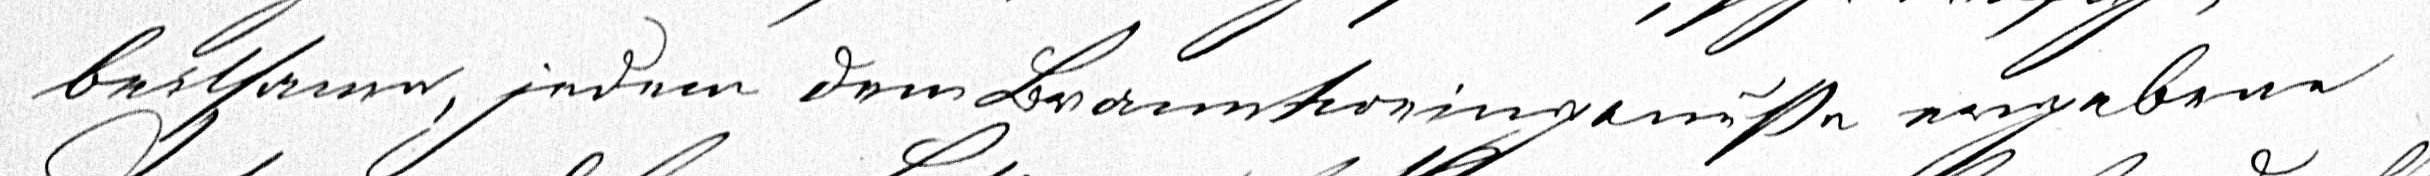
beitsame, jedem dem Branntweingenuße ergebene
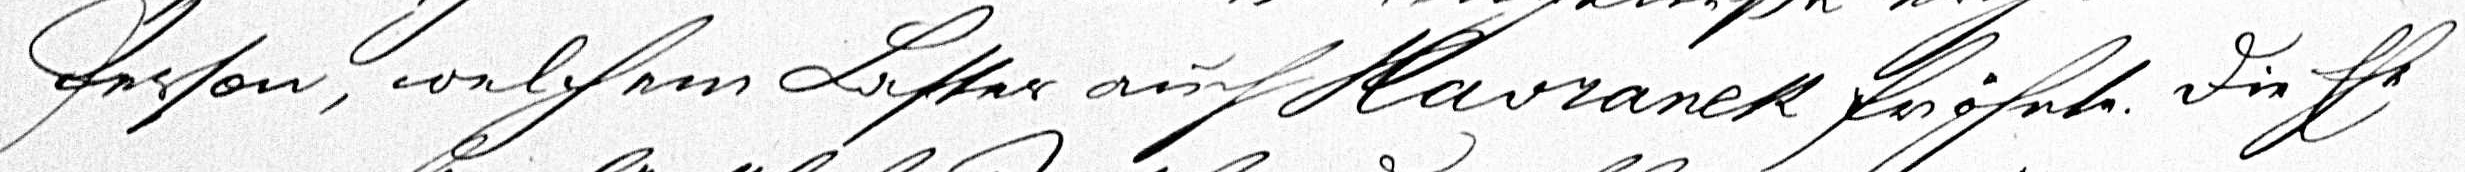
Person, welchem Laster auch Havranek fröhete. Die Ehe
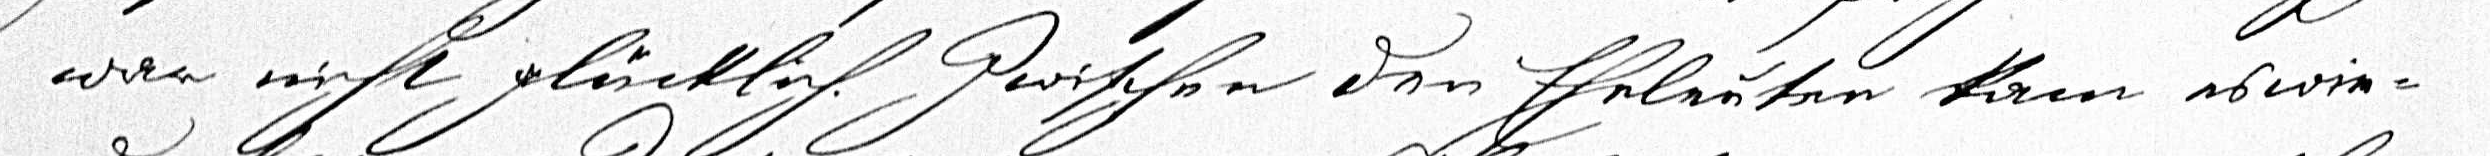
war nicht glücklich. Zwischen den Eheleuten kam es wie¬
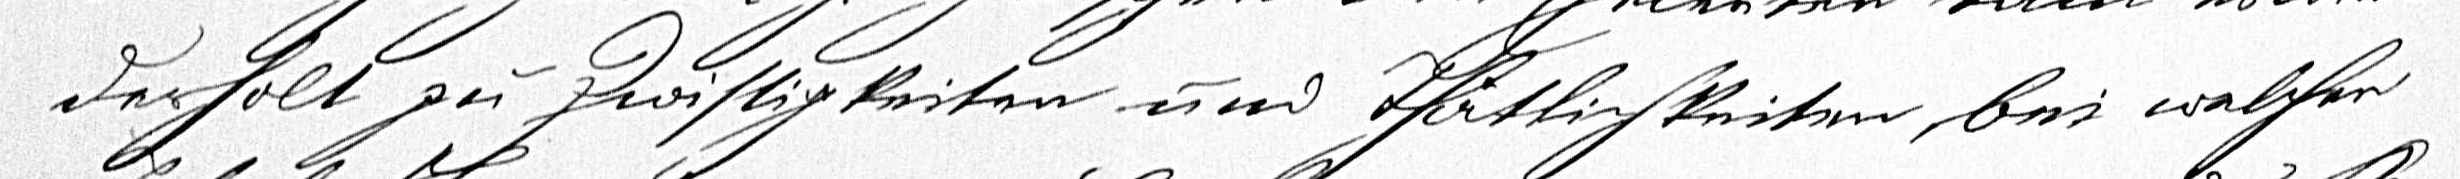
derholt zu Zwistigkeiten und Thätlichkeiten bei welcher
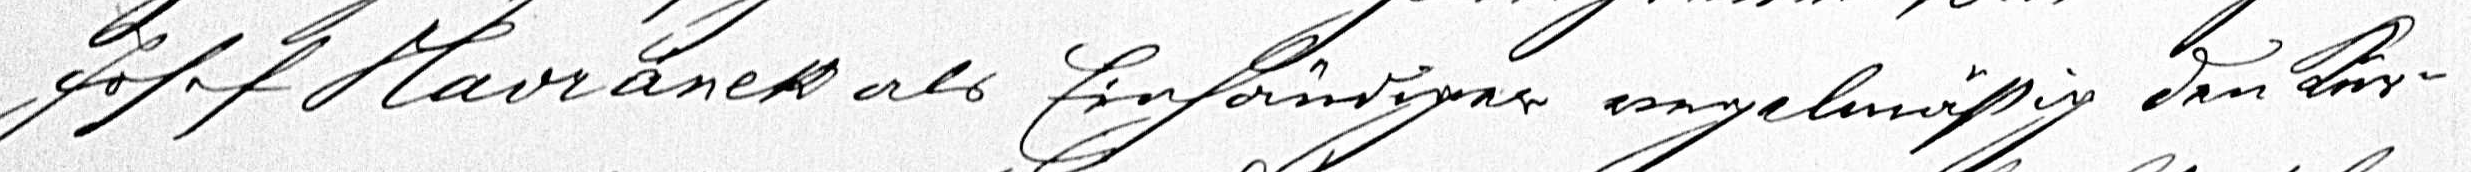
Josef Havránek als Einhändiger regelmäßig den kür¬
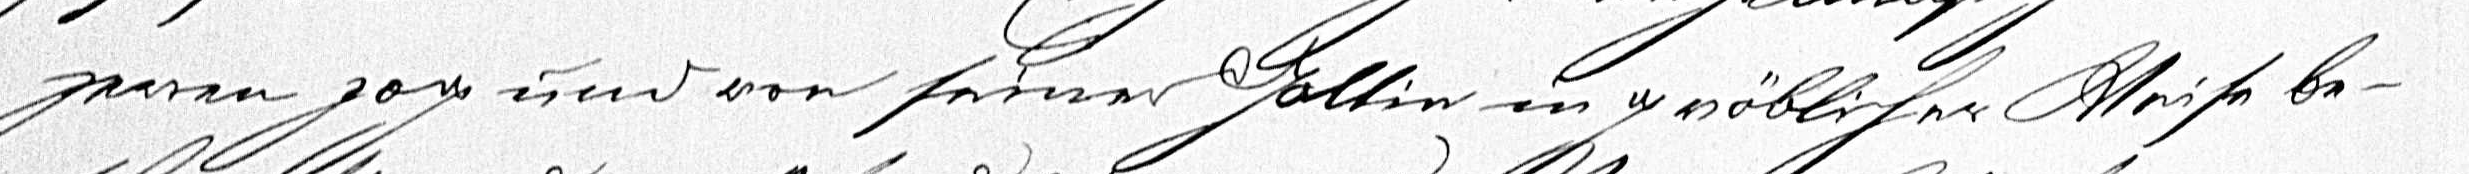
zeren zog und von seiner Gattin in gröblicher Weise be¬
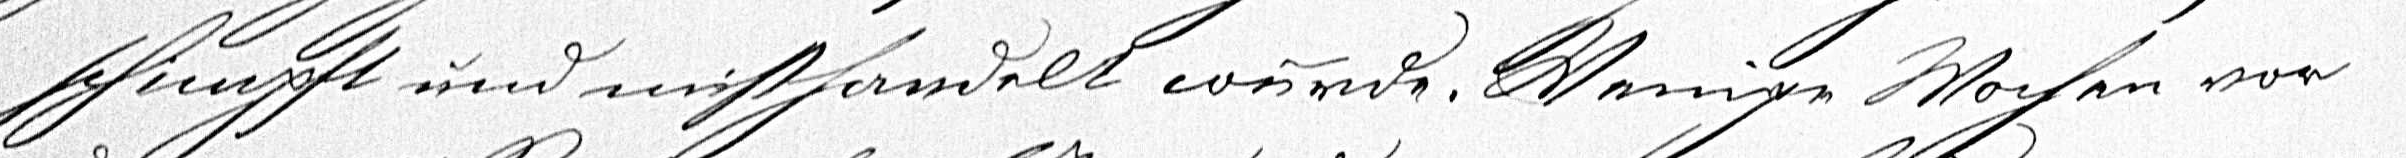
schimpft und mißhandelt wurde. Wenige Wochen vor
